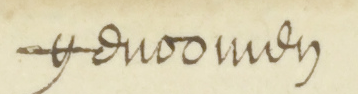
genoomen
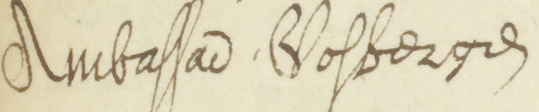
Ambassadr. Vosbergen
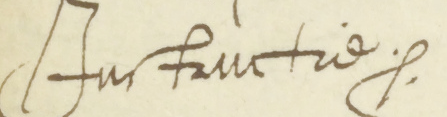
Instructie.s.
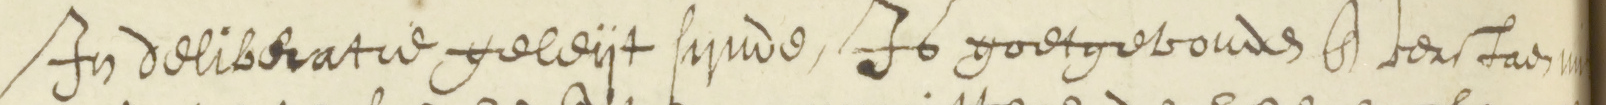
In deliberatie geleijt synde, Is goetgevonden & verstaen mi
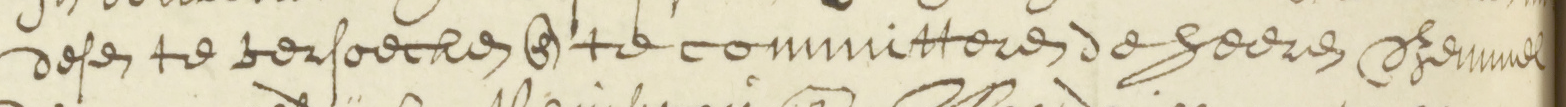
desen te versoecken & te committeren de heeren Bemmel
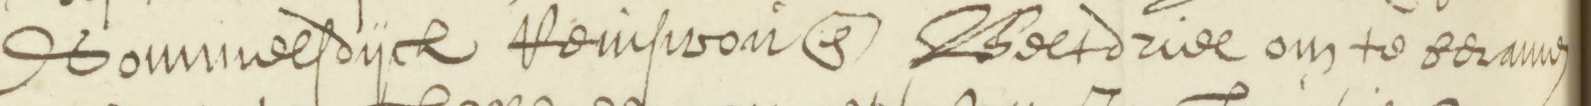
Sommelsdijck Reinswou & Veltdriel om te beramen
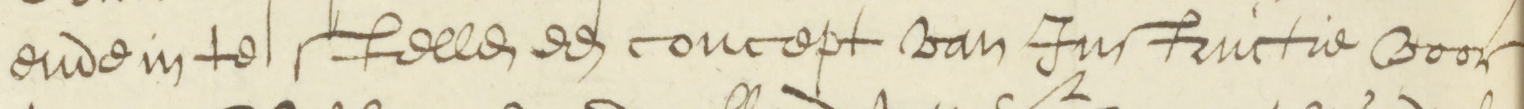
ende in te stellen een concept van Instructie voor
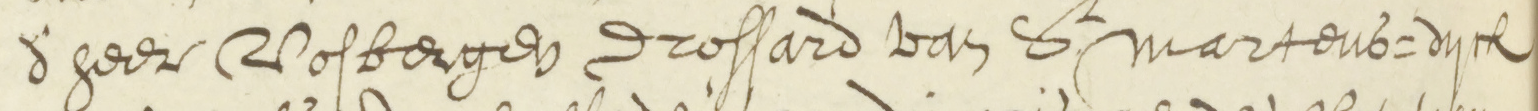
d'heer Vosbergen Drossard van St. Martens=dyck
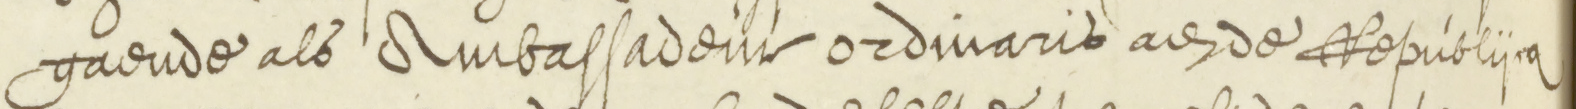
gaende als Ambassadeur ordinaris aende Republijcq
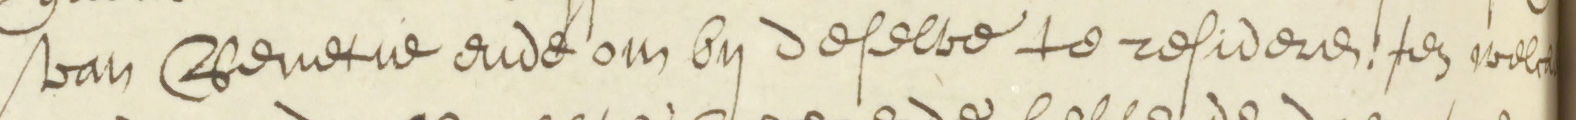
van Venetie ende om by deselve te resideren ten welck
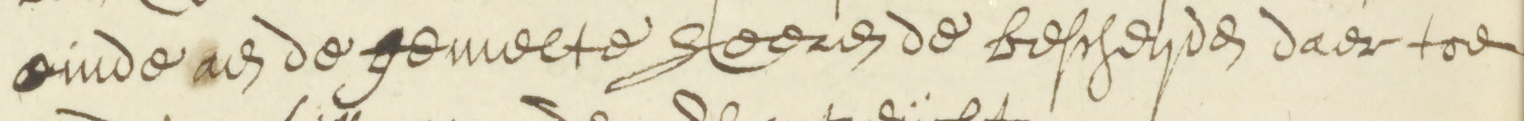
einde aen de gemelte heeren de bescheyden daer toe
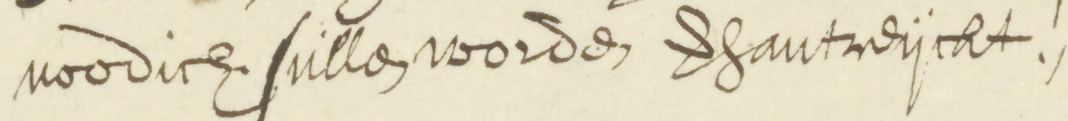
noodich sullen worden vhantreijckt.
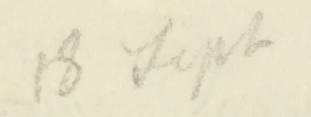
18 Sept
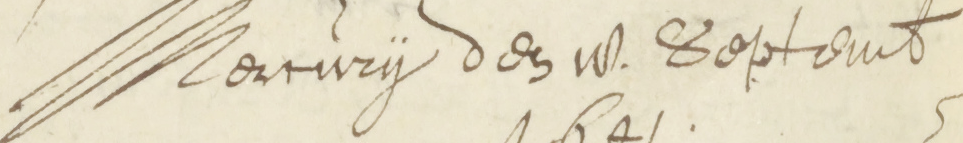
Mercurij den 18. Septemb
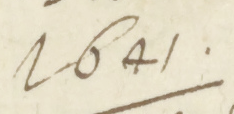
1641.
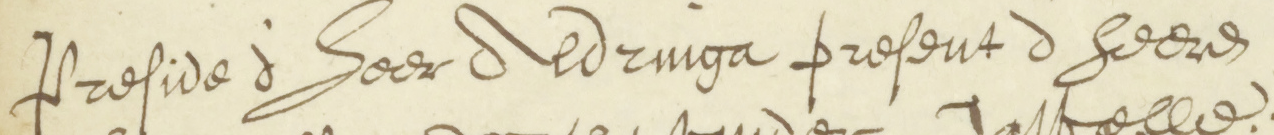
Preside d'Heer Aldringa present d'heeren
